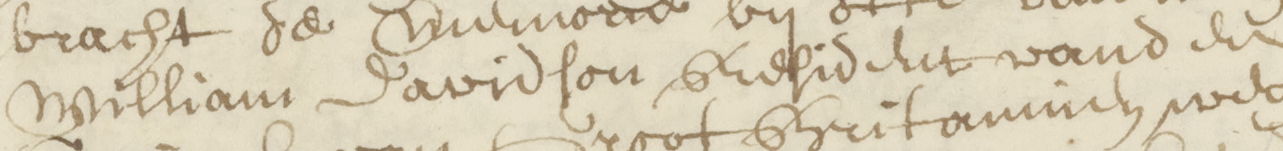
William Davidson Resident vanden
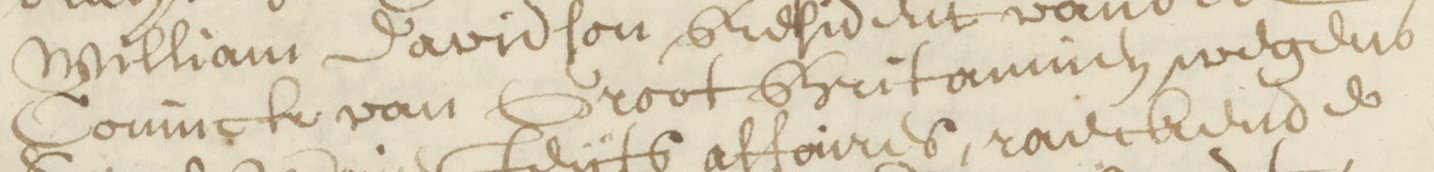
Coninck van Groot Britannien wegens
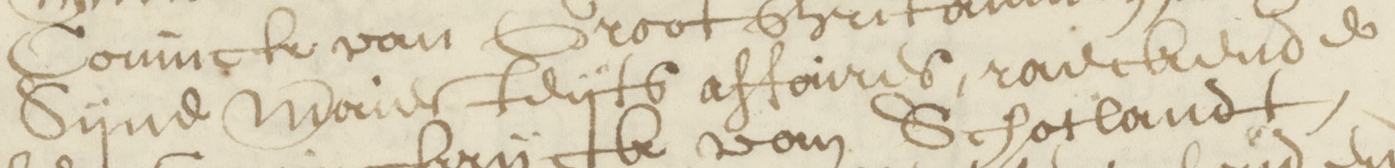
Sijne Maiesteijts affaires, raeckende
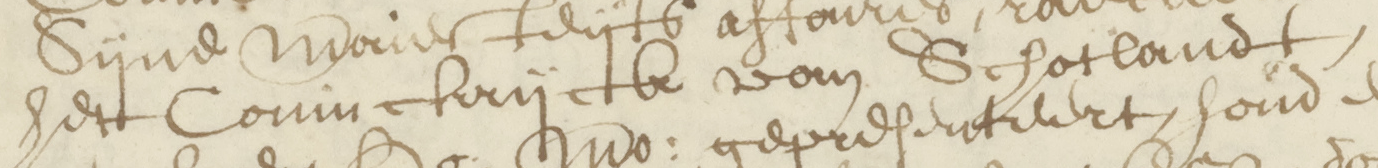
het Coninckrijck van Schotlandt,
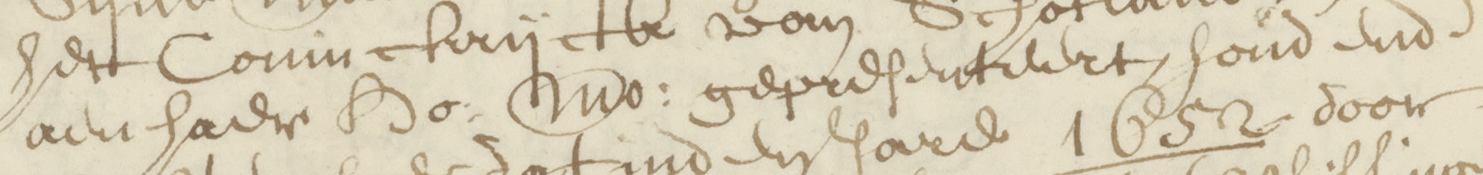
aen haer Ho:Mo: gepresenteert, houdende
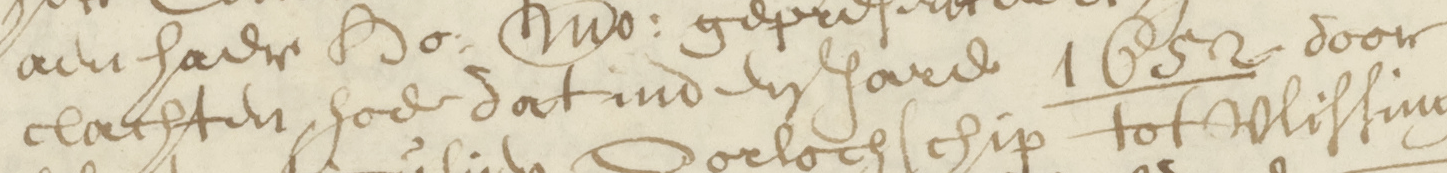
clachten hoe dat inden jare 1652 door
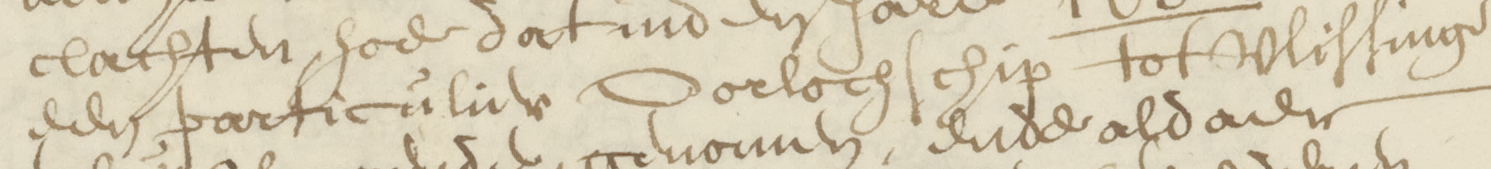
een particulier Oorlochschip tot Vlissinge
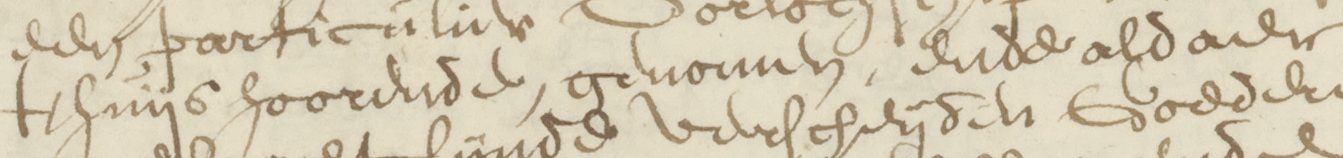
thuijs hoorende, genomen, ende aldaer
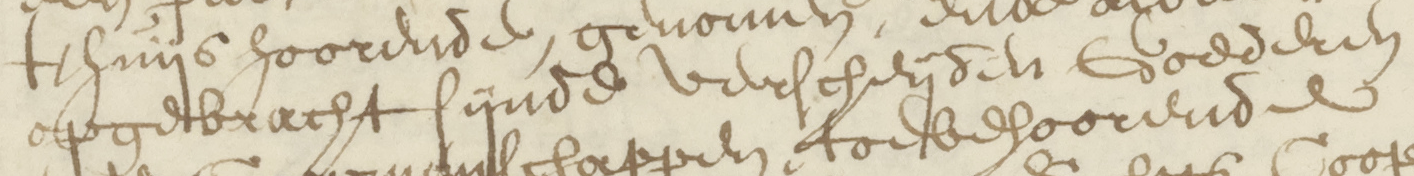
opgebracht sijnde verscheijden Goederen
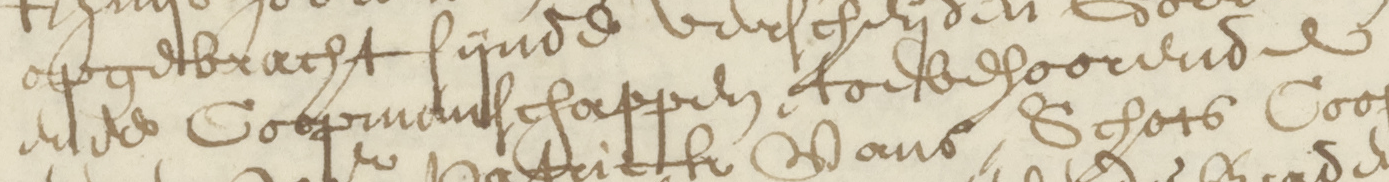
ende Coopmanschappen toebehoorende
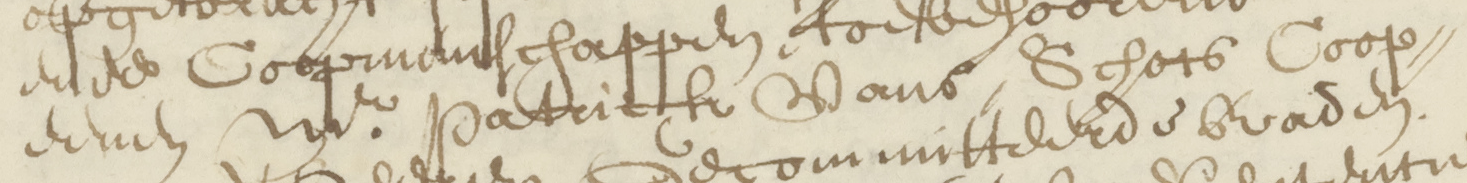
eenen mr. Patrick Vans, Schots Coop„
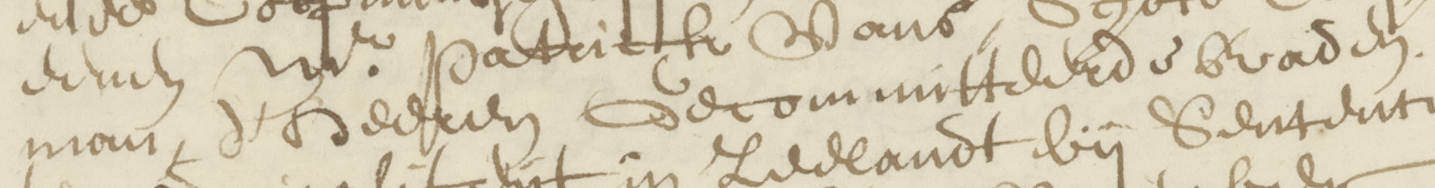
man, d'Heeren Gecommiteerde Raden
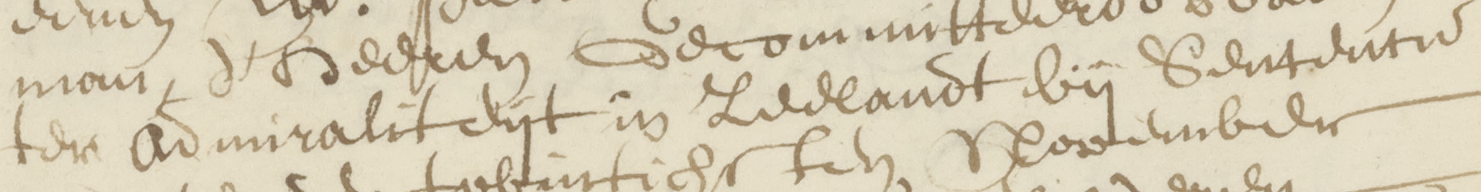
ter Admiraliteijt in Zeelandt bij Sententie
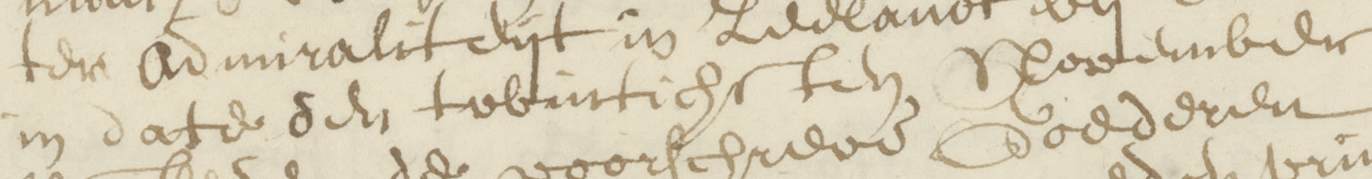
in date den twintichsten november
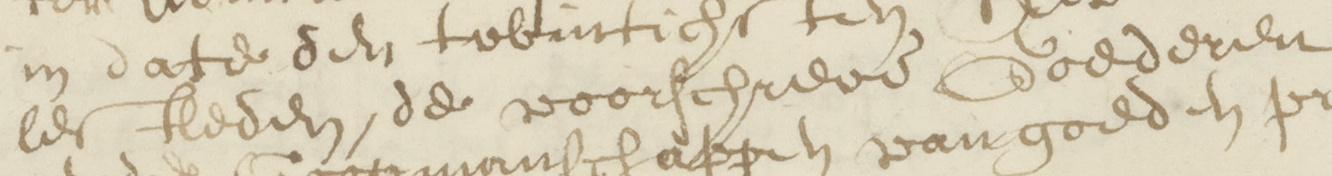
lestleden, de voorschreve Goederen
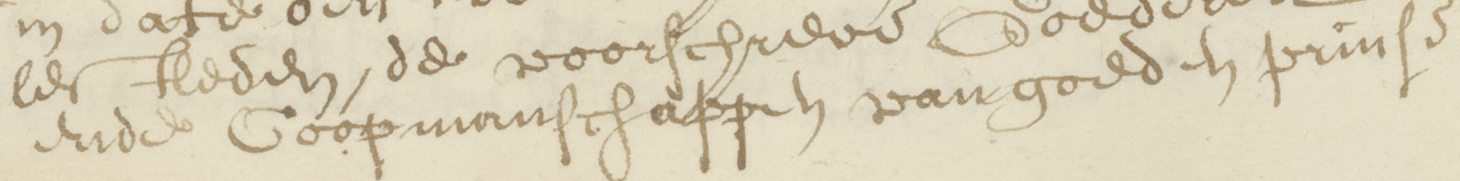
ende Coopmanschappen van goeden prinse
